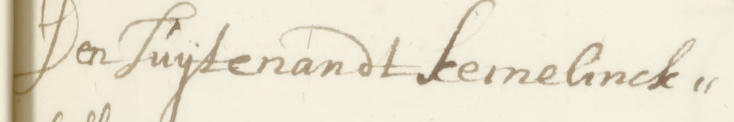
Den Luijtenandt kemelinck„
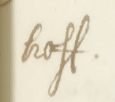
hoff.
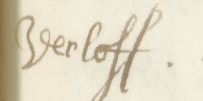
Verloff.
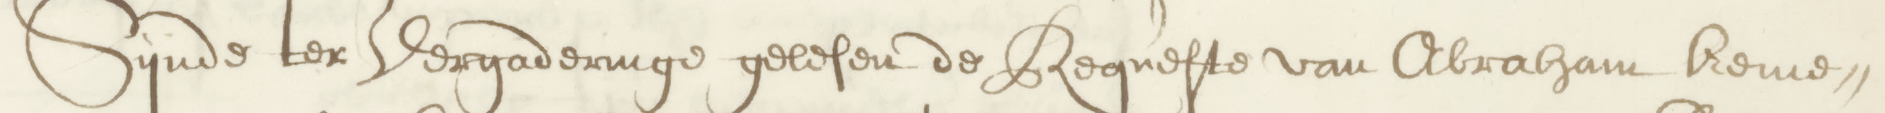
Sijnde ter Vergaderinge gelesen de Requeste van Abraham keme„
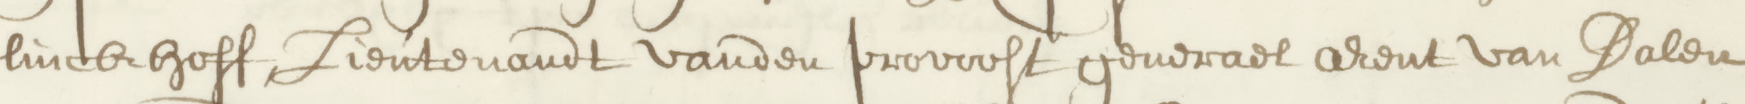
linckhoff Lieutenandt vanden provoost generael Arent van Dalen
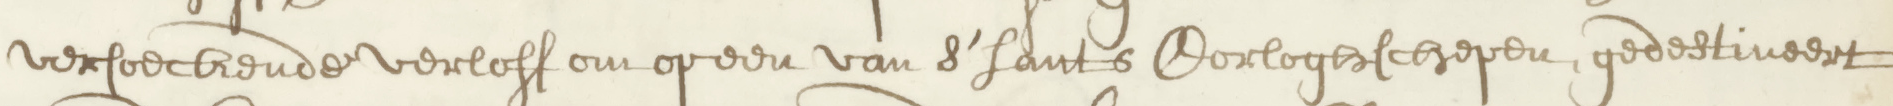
versoeckende verloff om op een van s'Lants Oorloghschepen, gedestineert
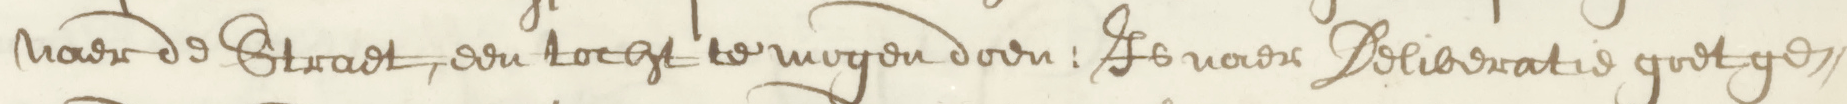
naer de Straet, een tocht te mogen doen: Is naer Deliberatie goetge„
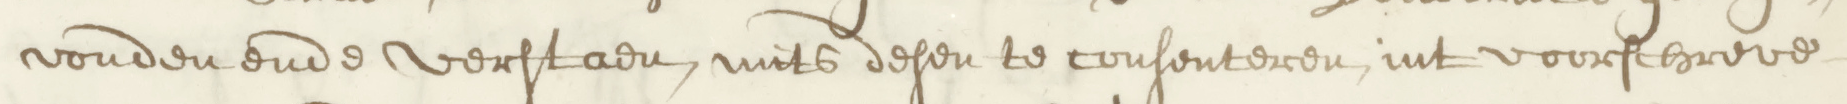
vonden ende verstaen, mits desen te consenteren, int voorschreve
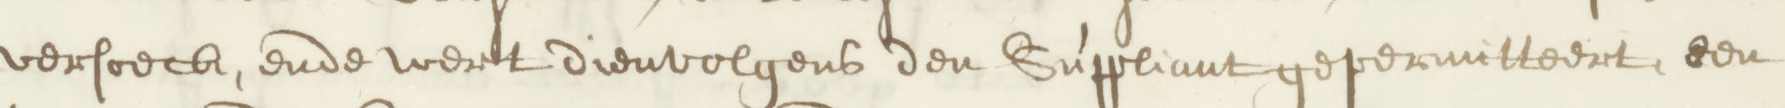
versoeck, ende wert dienvolgens den Suppliant gepermitteert, een
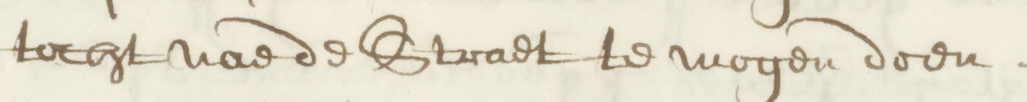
tocht nae de Straet te mogen doen.
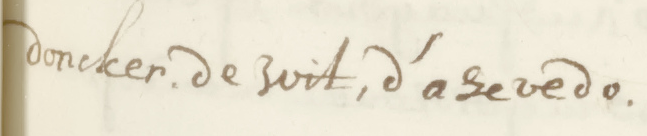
Doncker, de Wit, d'azevedo
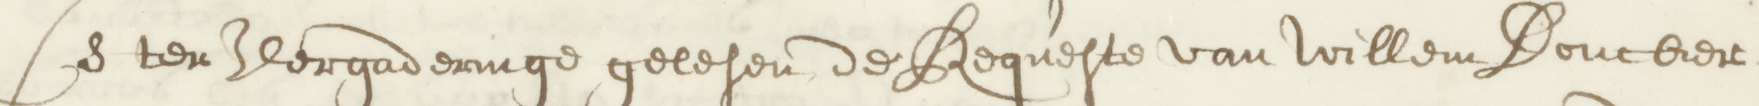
Is ter Vergaderinge gelesen de Requeste van Willem Doncker,
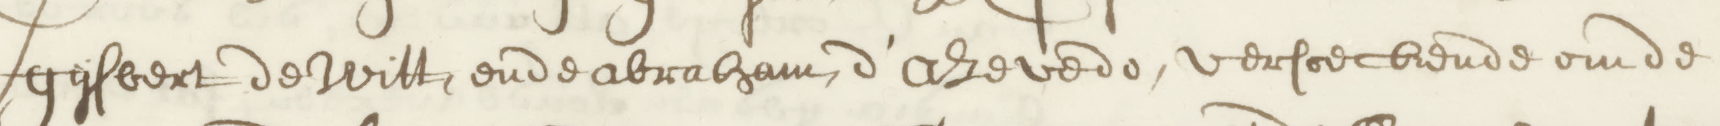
Gijsbert de Witt, ende abraham, d‛Azevedo, versoeckende om de
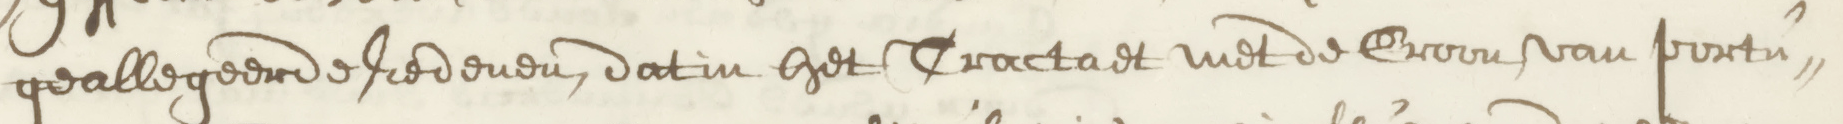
geallegeerde redenen, dat in het Tractaet met de Croon van portu„
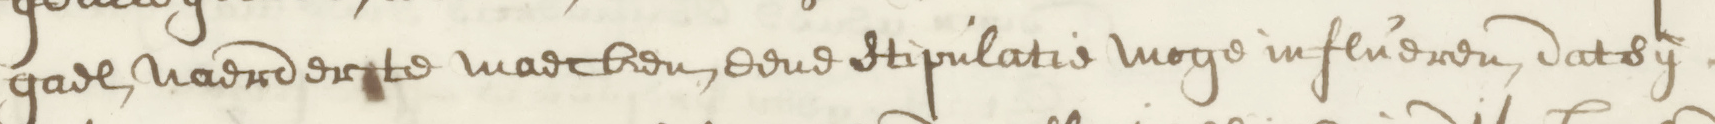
gael, naerder te maecken, eene Stipulatie moge influeren, dat sij
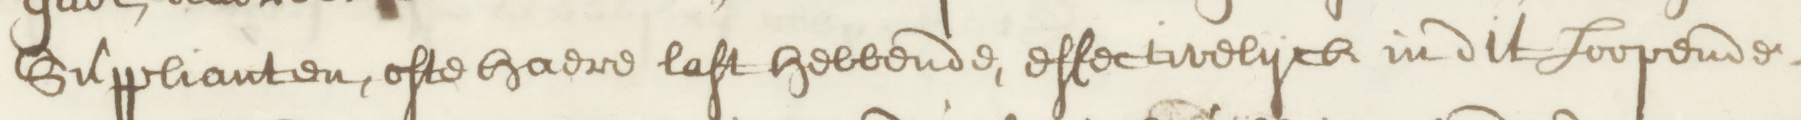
Supplianten, ofte haere laft hebbende, effectivelijck in dit Loopende
